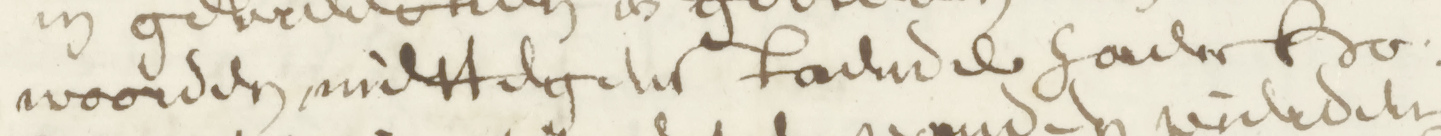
woorden niettegenstaende haer Ho:
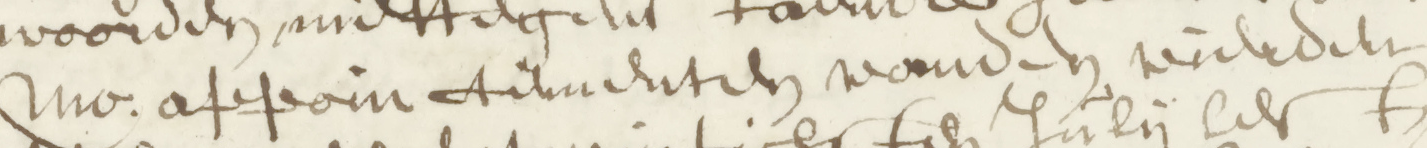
Mo: appoinctementen vanden vierden
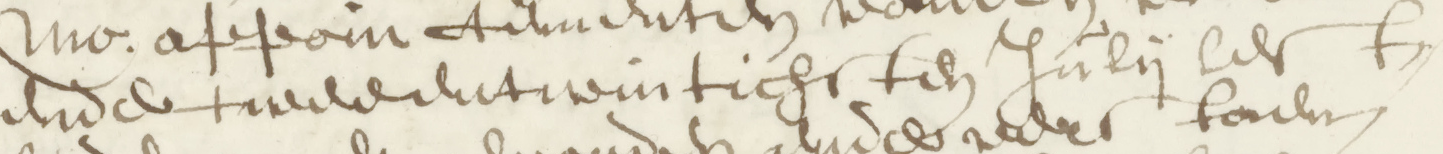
ende tweeentwintichsten Julij lest„
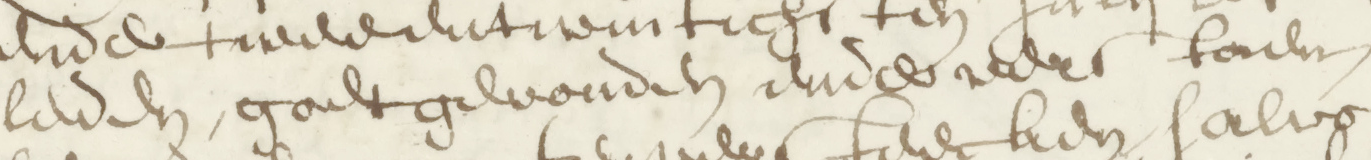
leden, goetgevonden ende verstaen
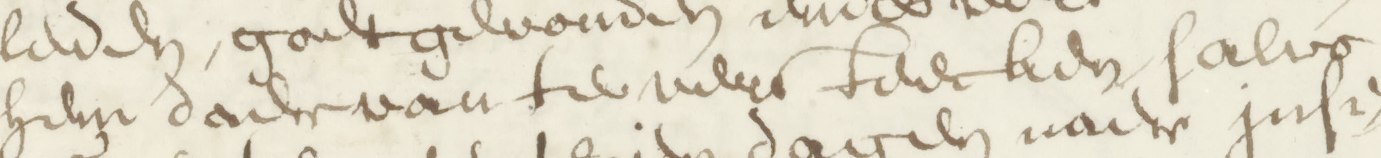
hem daervan te versteecken, salvo
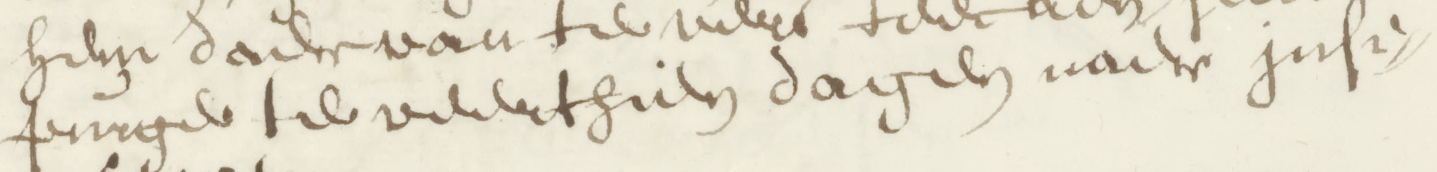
purge te veerthien dagen naer insi„
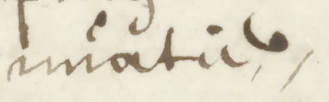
nuatie.
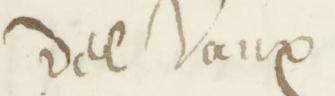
del Vaux
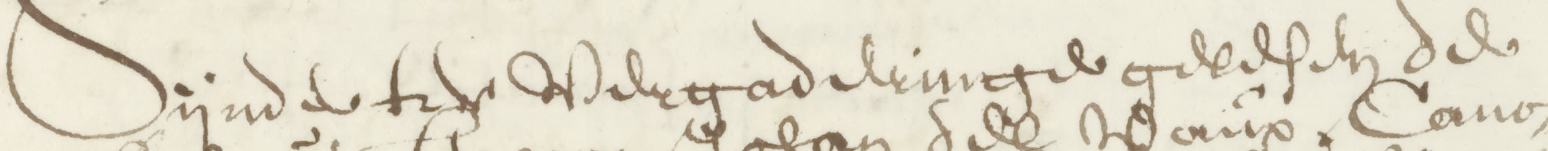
Sijnde ter Vergaderinge gelesen de
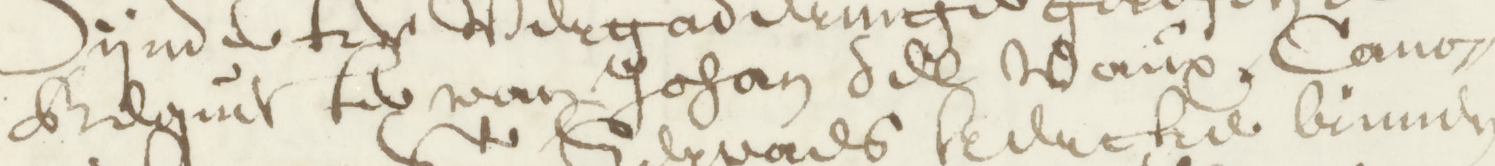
Requeste van Johan del Vaux, Cano„
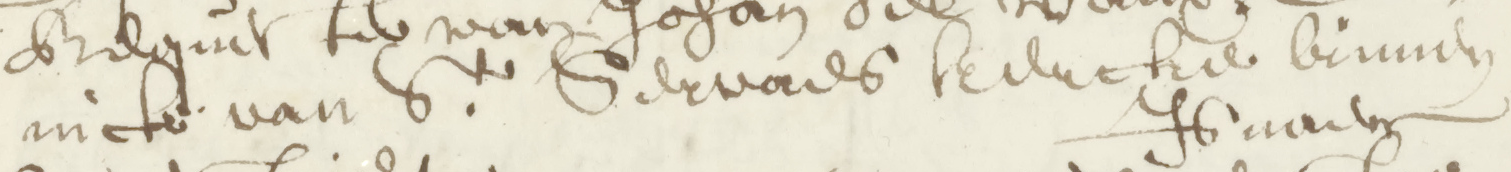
nick van St. Servaes kercke binnen
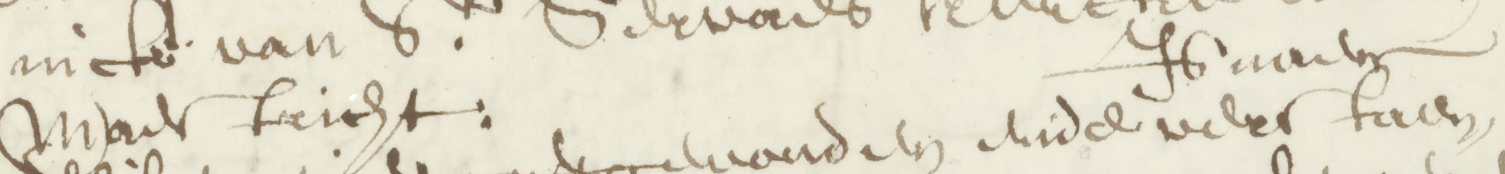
Maestricht: Is naer
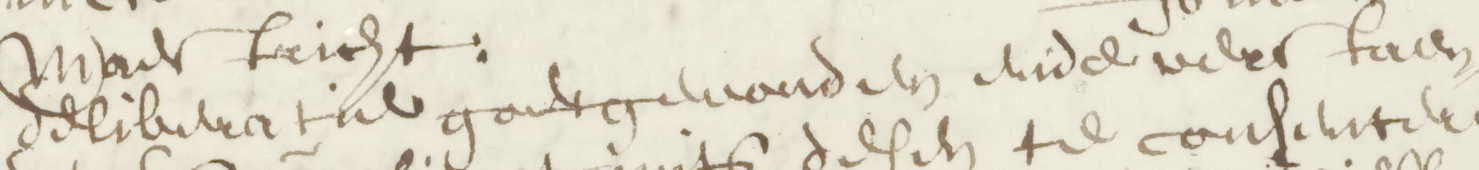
deliberatie goetgevonden ende verstaen,
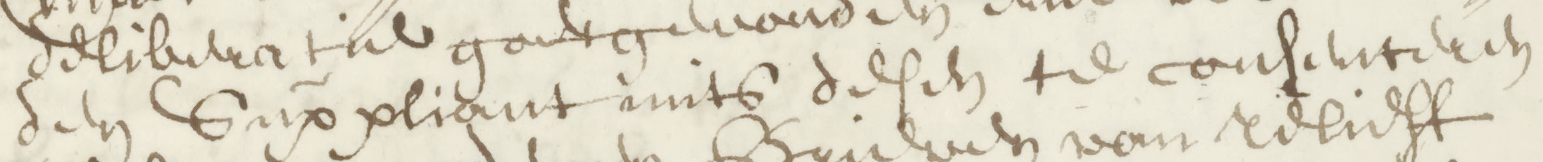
den Suppliant mits desen te consenteren
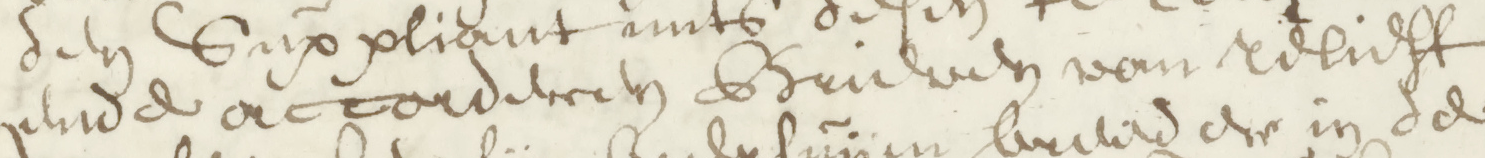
ende accorderen Brieven van relieff
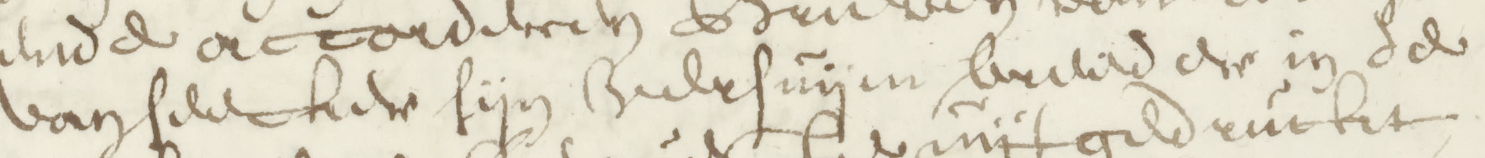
van seecker sijn versuijm breeder in de
